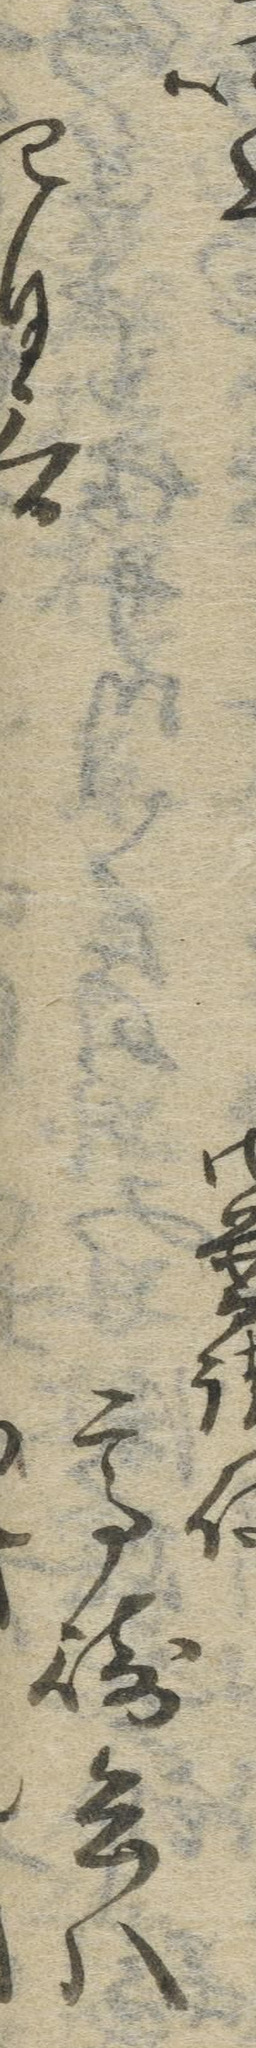四月三日高崎善八
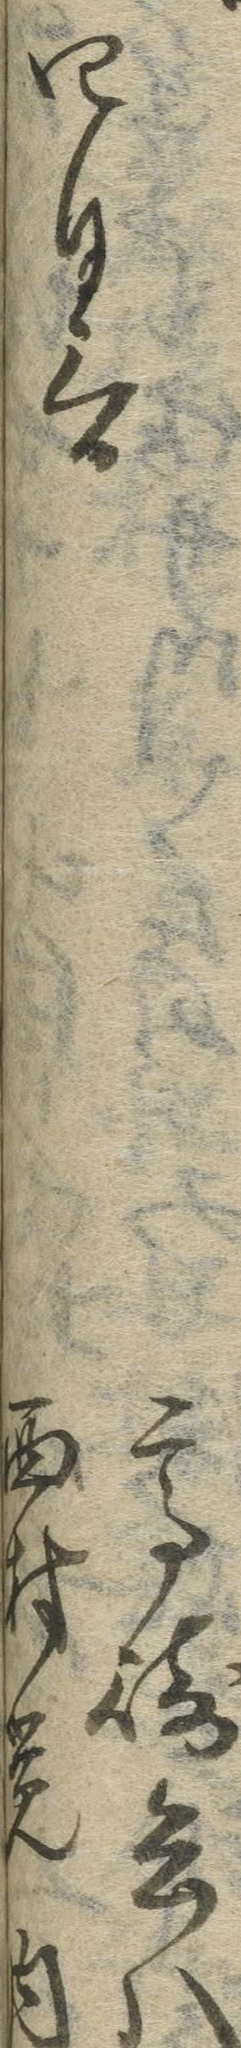四月三日高崎善八
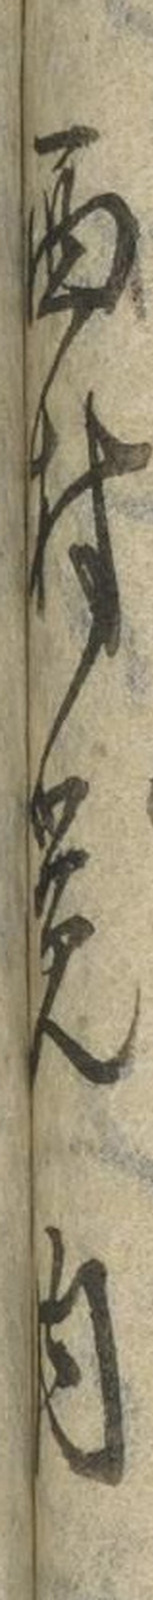西村覚内
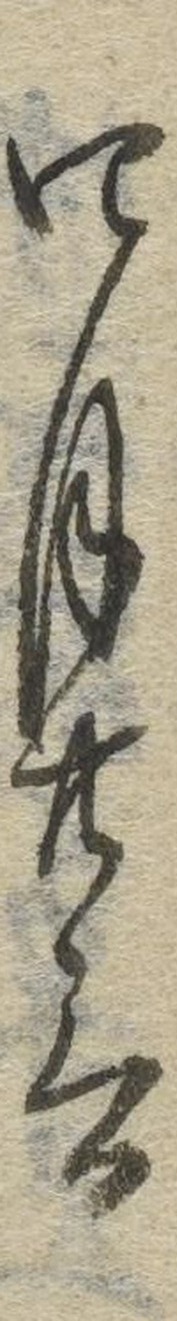四月廿三日
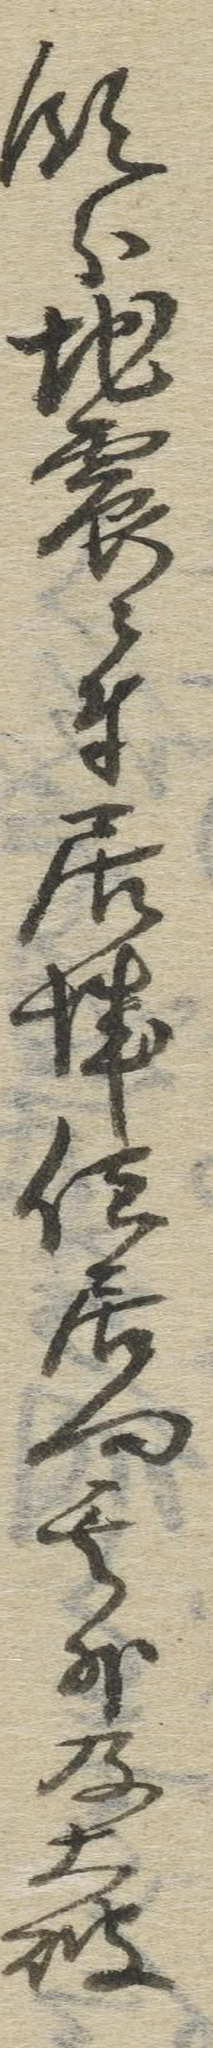領分地震二付居城住居向其外及大破
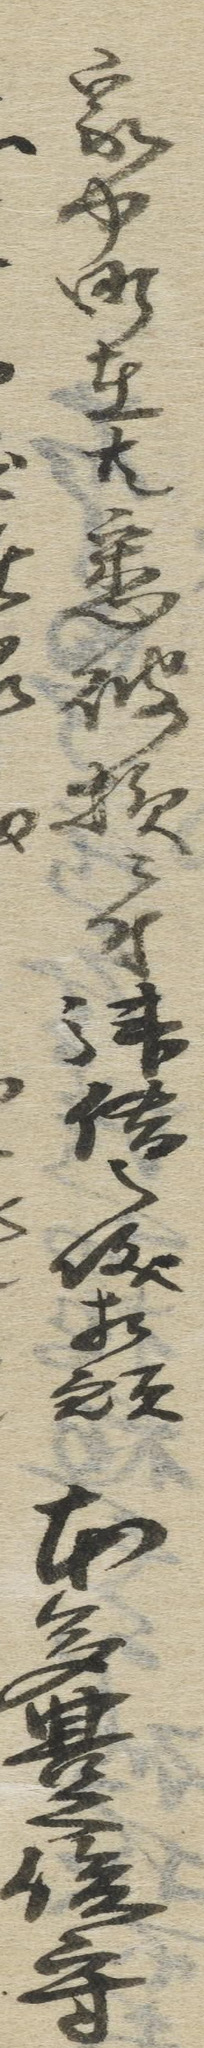家中町在共悉破損二付拝借之儀相願本多豊後守
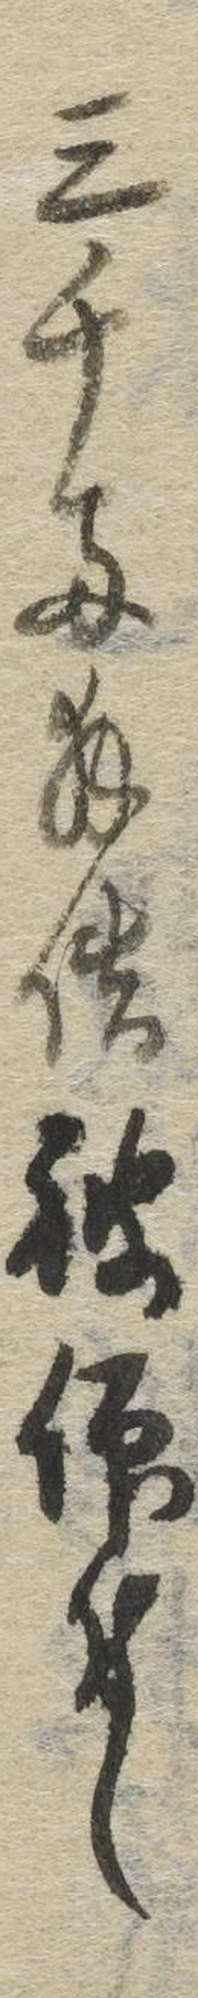三千両拝借被仰付之
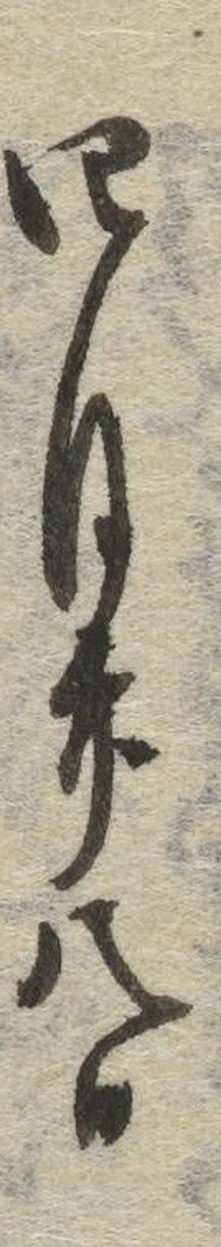四月廿八日
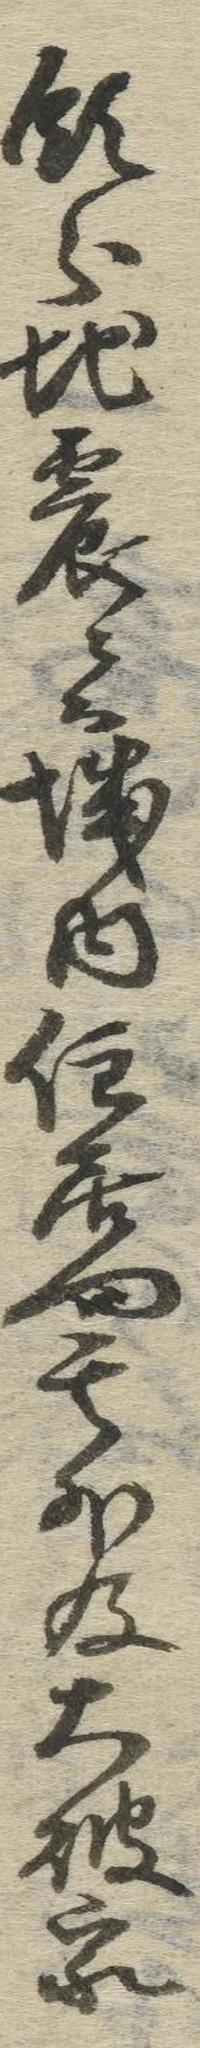領分地震二付居城住居向其外及大破家
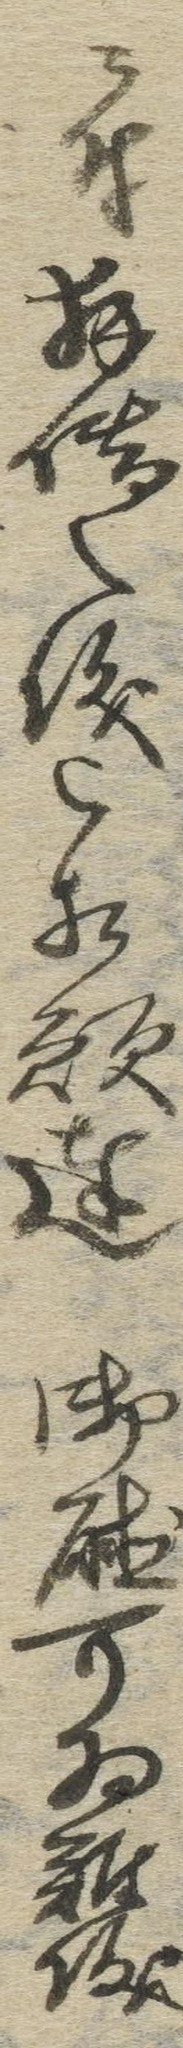二付拝借之儀被相願達御聴可為難儀
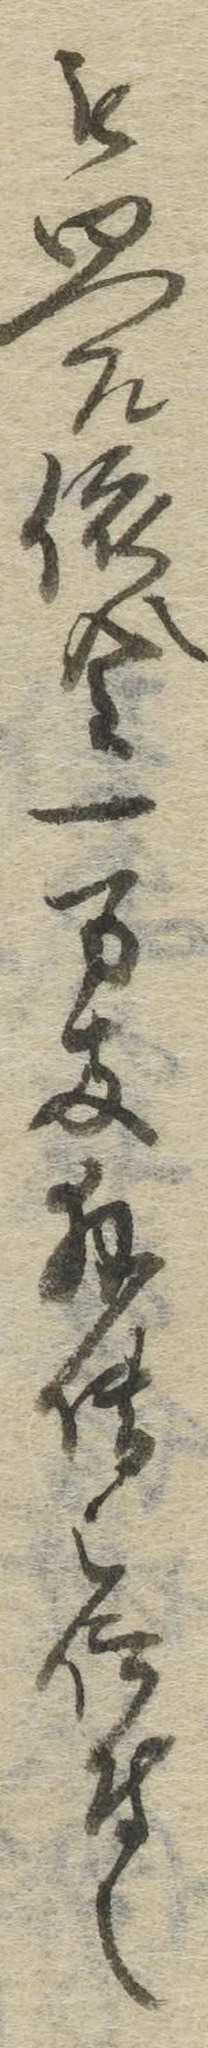被思召依之金一万両拝借被仰付之
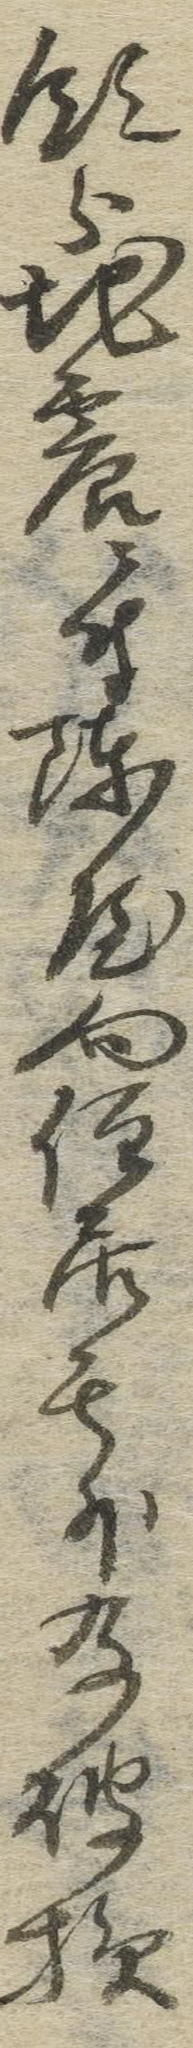領分地震二付陣屋向住居其外及破損
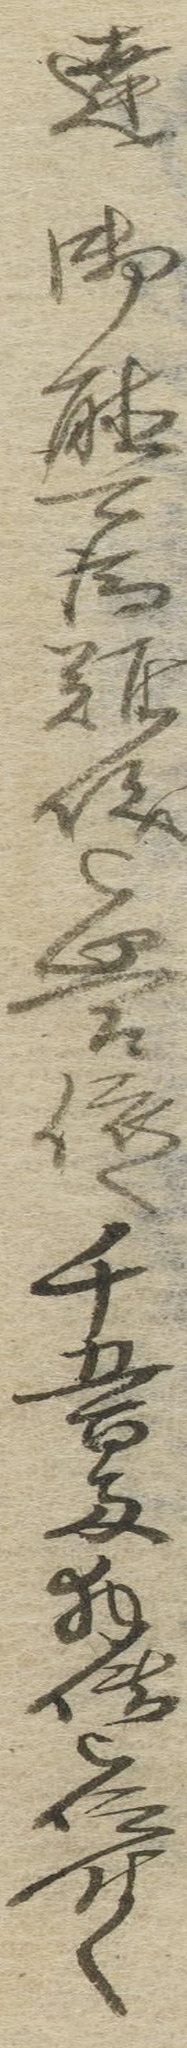達御聴可為難儀被思召依之千五百両拝借被仰付之

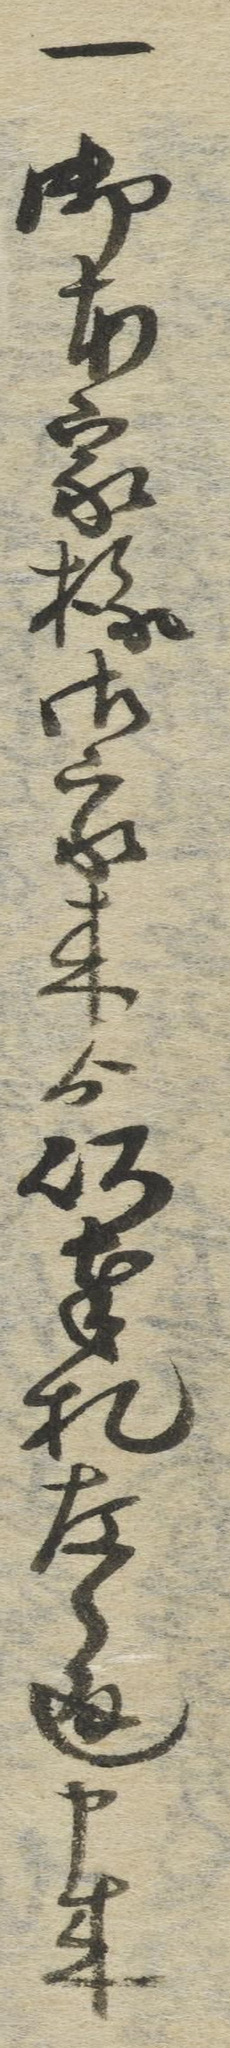一御本家様御家来ゟ以奉札左之通申来
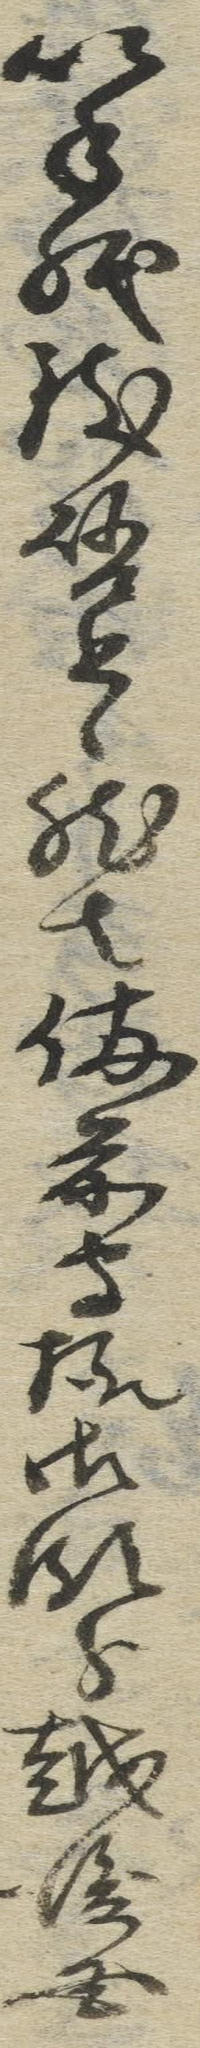以手紙致啓上候然者備前守様御領分越後国
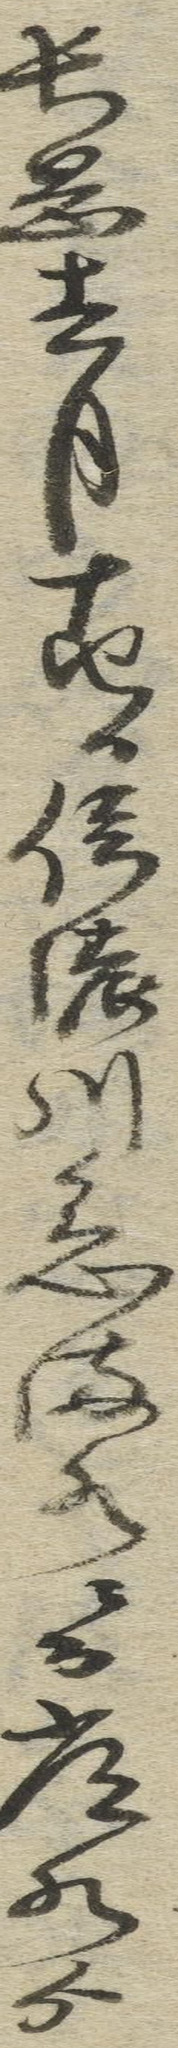長岡去月十四日信濃川急満水二而常水ゟ
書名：信濃越後　地震書留
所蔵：東京大学地震研究所図書室 Earthquake Research Institute Library, The University of Tokyo, JAPAN
